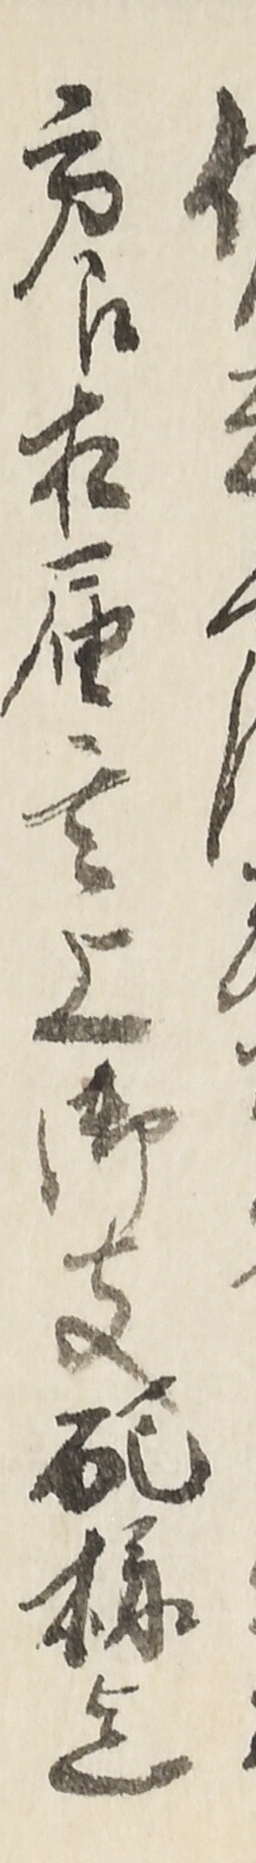方江相届其上御支配様迄
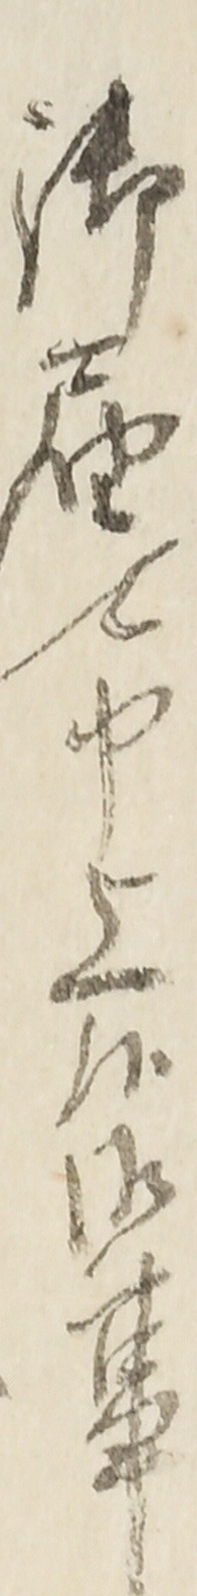御届可申上候御事
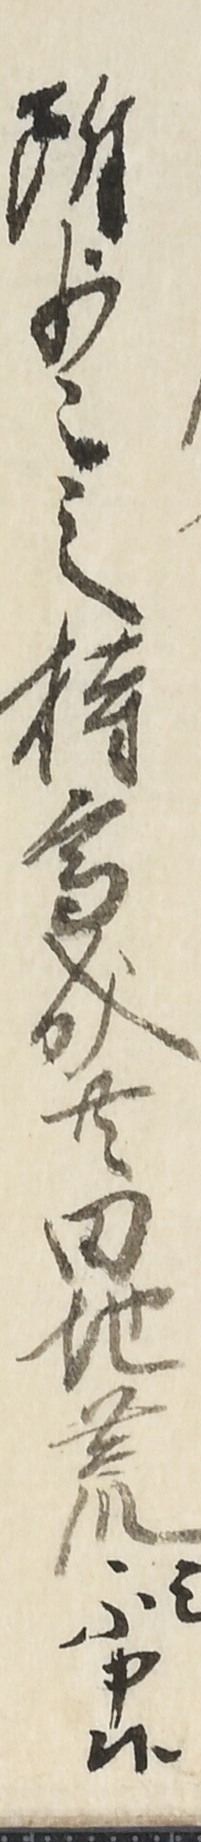附少々之持高成共田地荒シ不申候
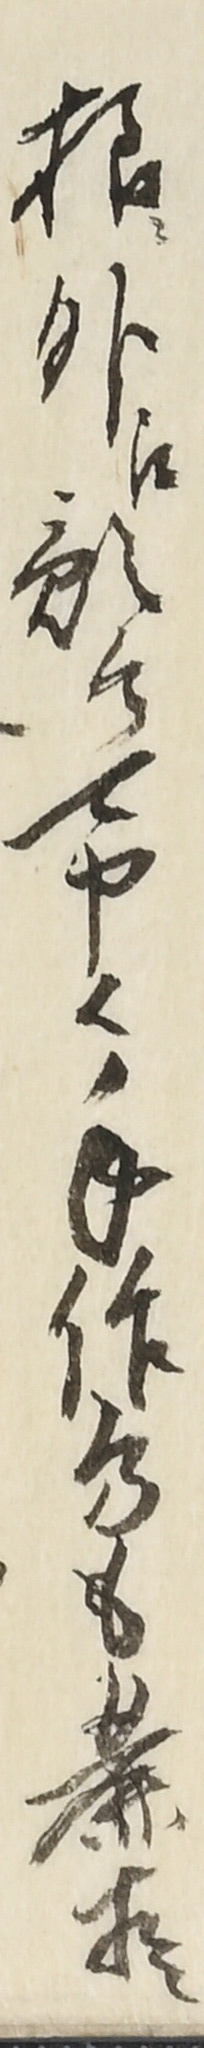様ニ外江預ケ可申候手作分も麁相ニ
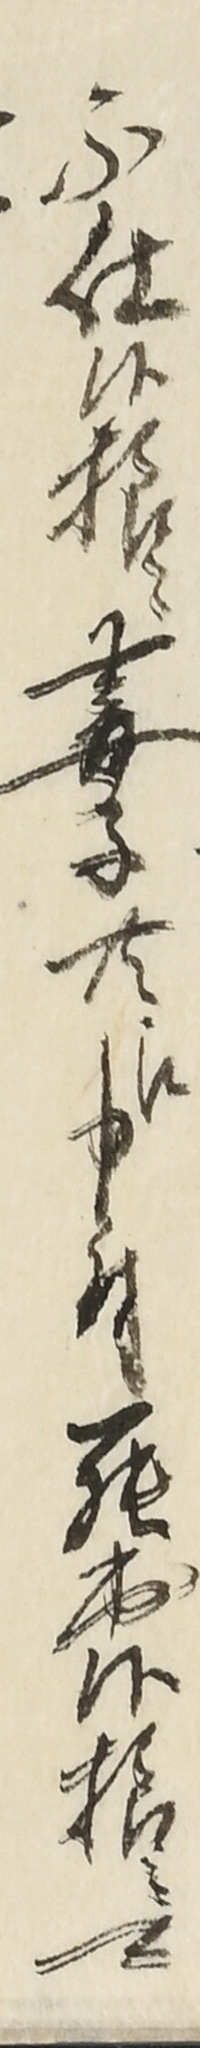不仕候様ニ妻子共江申付罷出候様ニ可
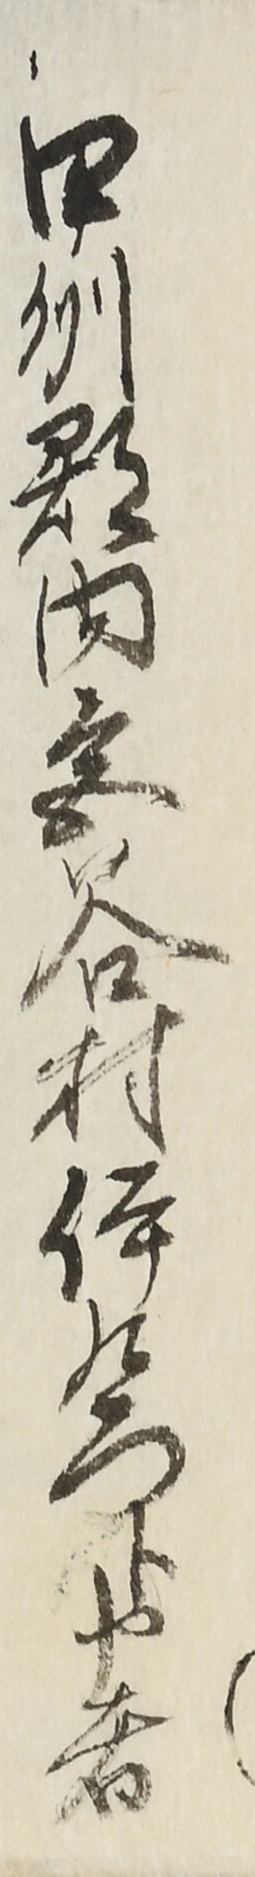甲州郡内宮谷村伊左衛門ト申者
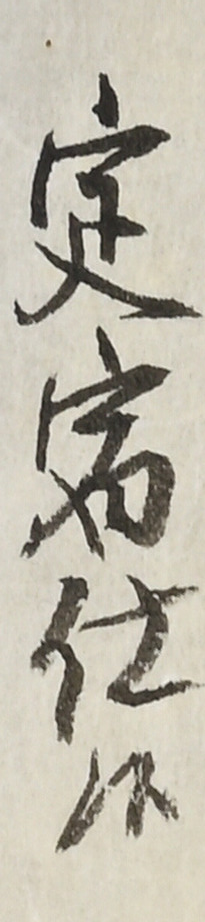定宿仕候

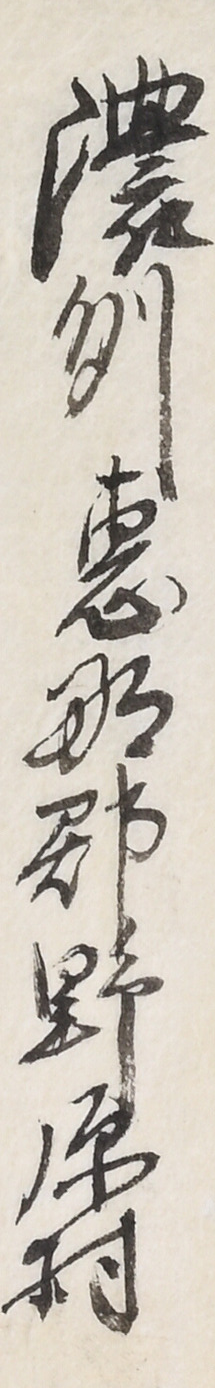濃州恵那郡野原村
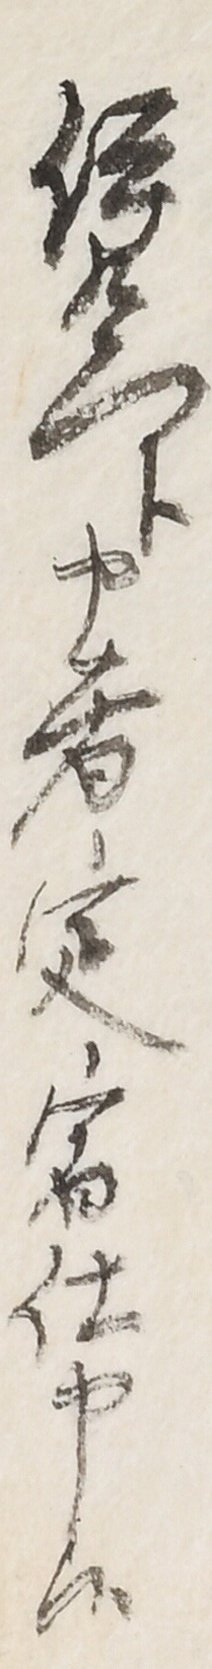伊左衛門ト申者定宿仕申候
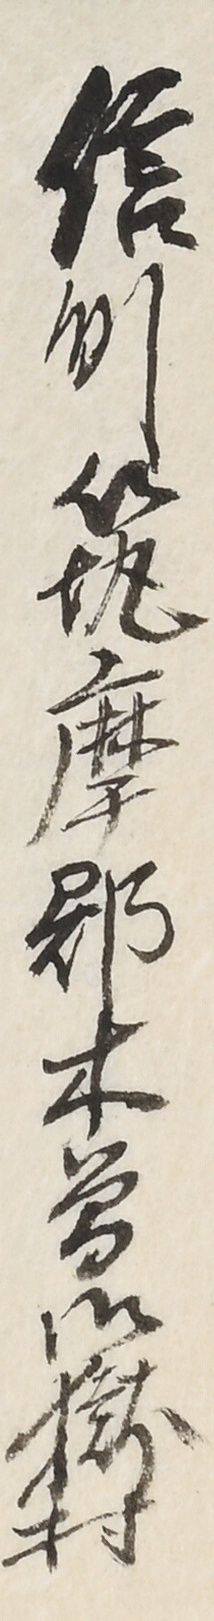信州筑摩郡木曽御嶽村
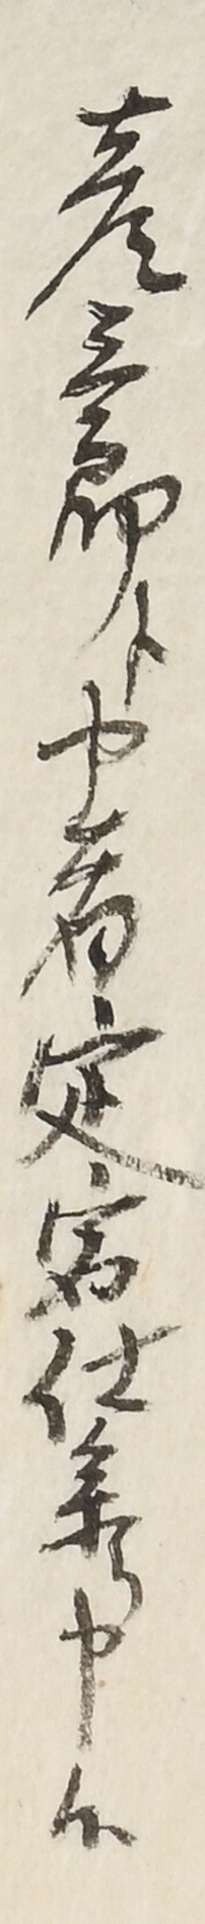彦太郎ト申者定宿仕参り申候
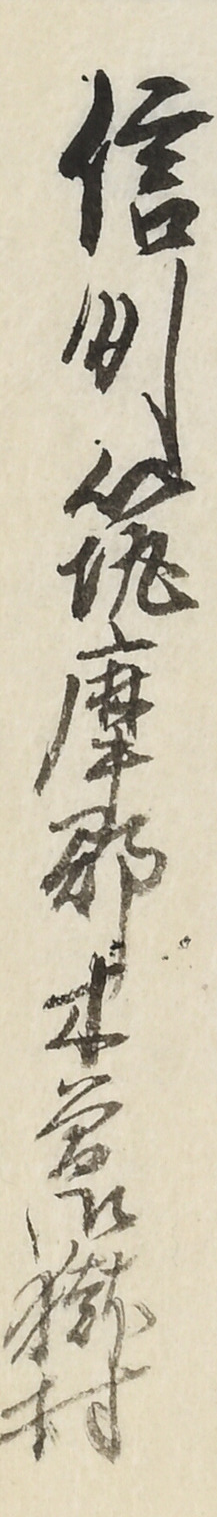信州筑摩郡木曽御嶽村
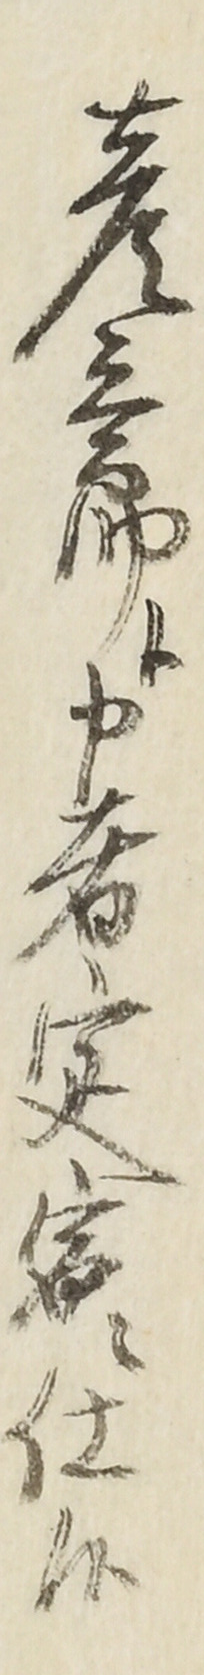彦太郎ト申者定宿ニ仕候
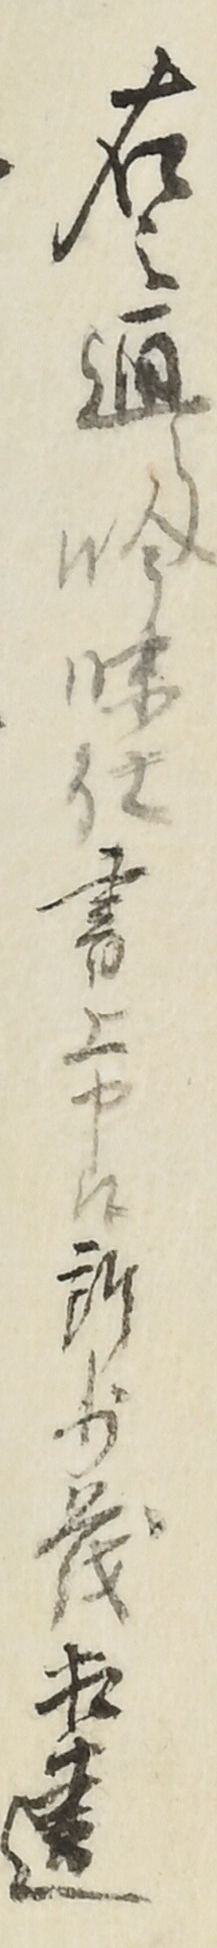右之通り吟味書上申候少茂相違
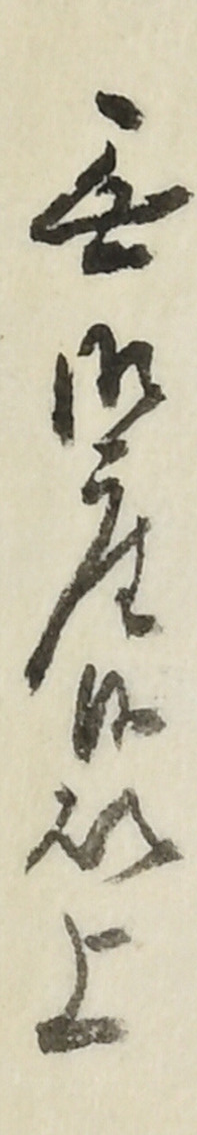無御座候以上
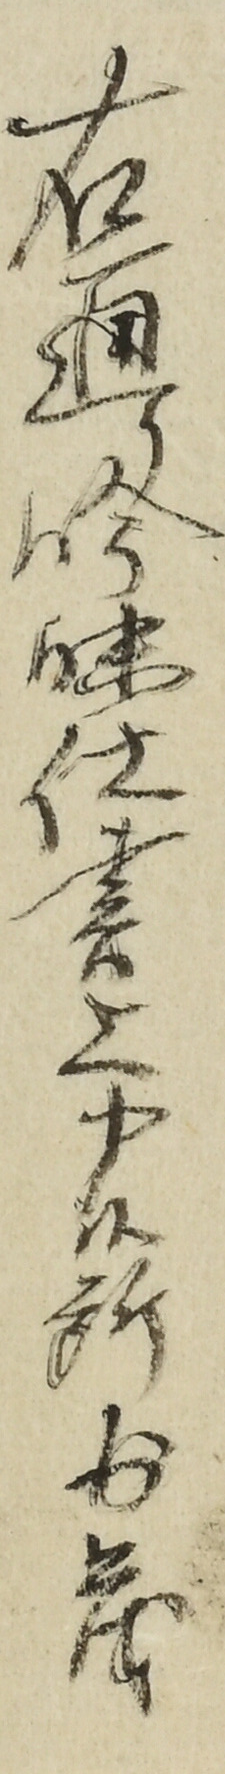右之通り吟味書上申候少茂相違
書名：文久四甲子年二月日他国石切稼書上帳
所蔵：伊那市立高遠町図書館・合同会社AMANE
